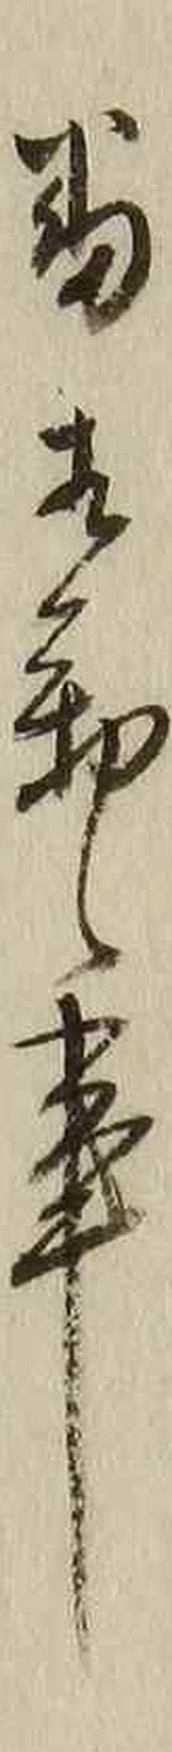番相勤候事
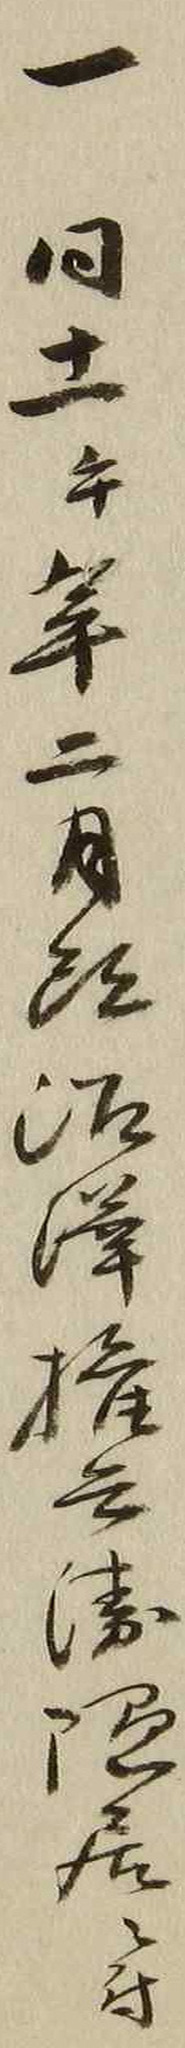一同十一午年二月頭沼沢権兵衛隠居ニ付
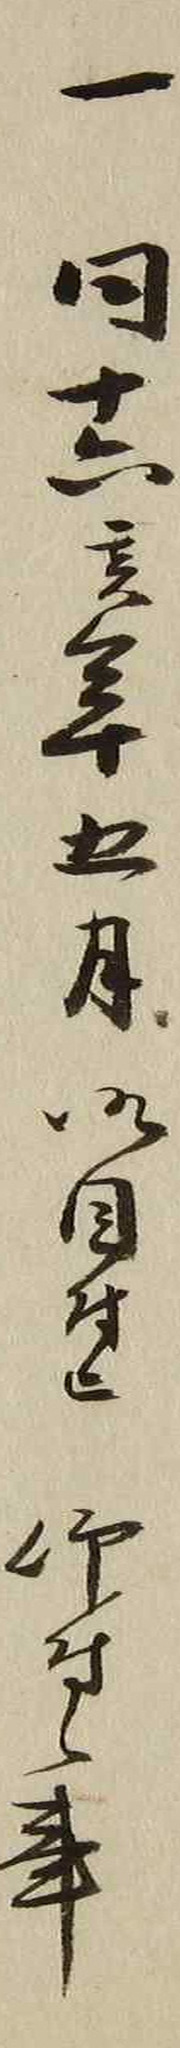一同十六亥年五月御目付被仰付候事
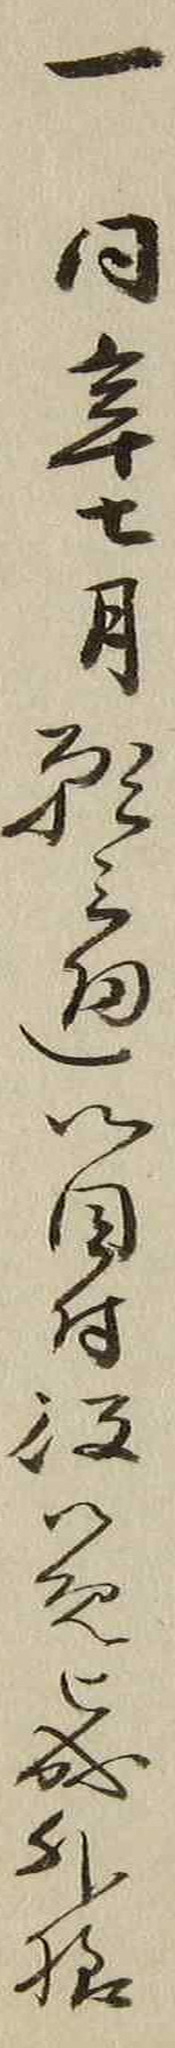一同年七月願之通御目付役御免被成外様
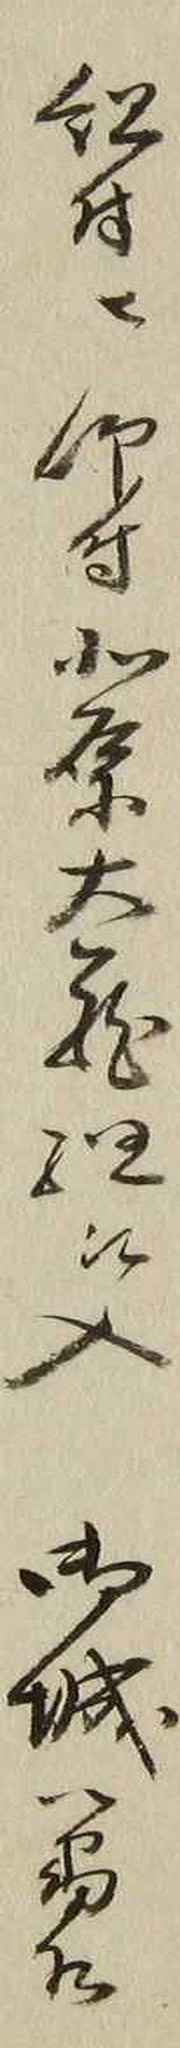組付被仰付北原大蔵組江入御城御番相
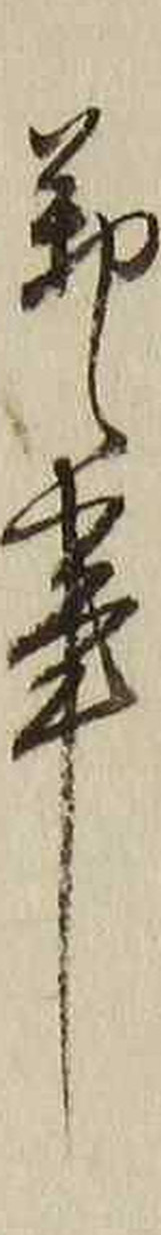勤候事
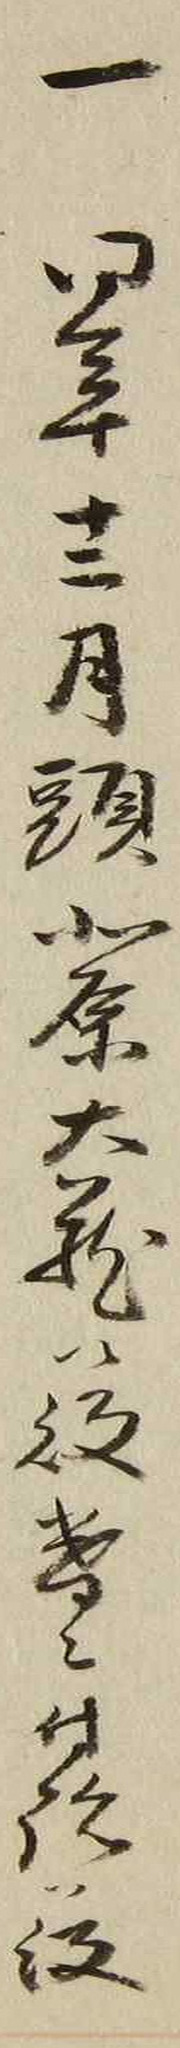一同年十二月頭北原大蔵御役替ニ付跡御役
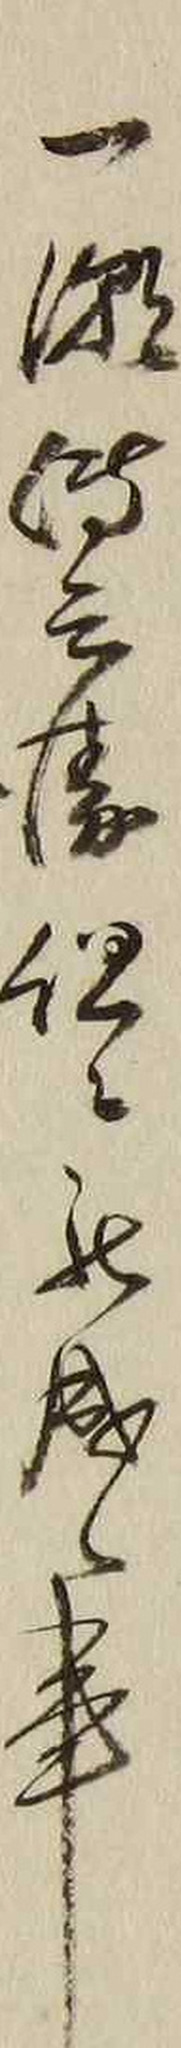一一瀬伝兵衛組ニ罷成候事
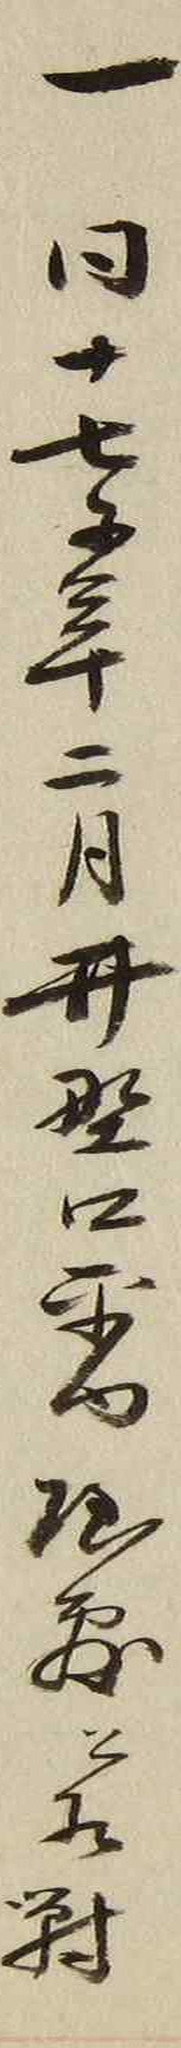一同十七子年二月井野口平内屋敷と相対
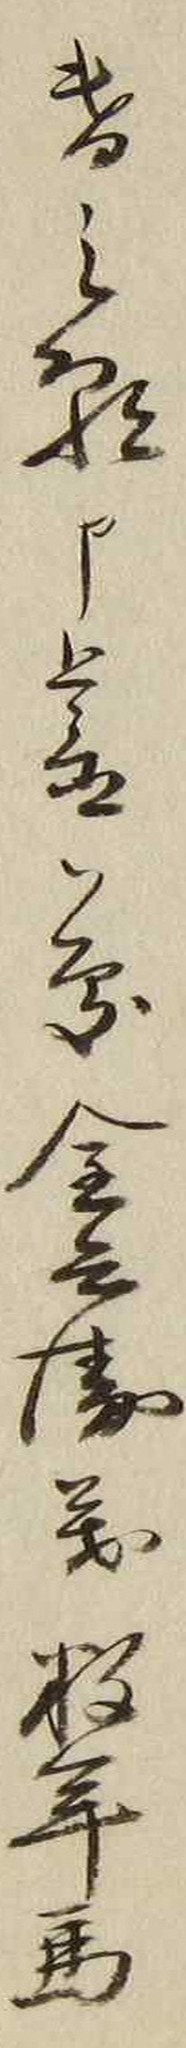替之願申上置候処金兵衛義数年馬
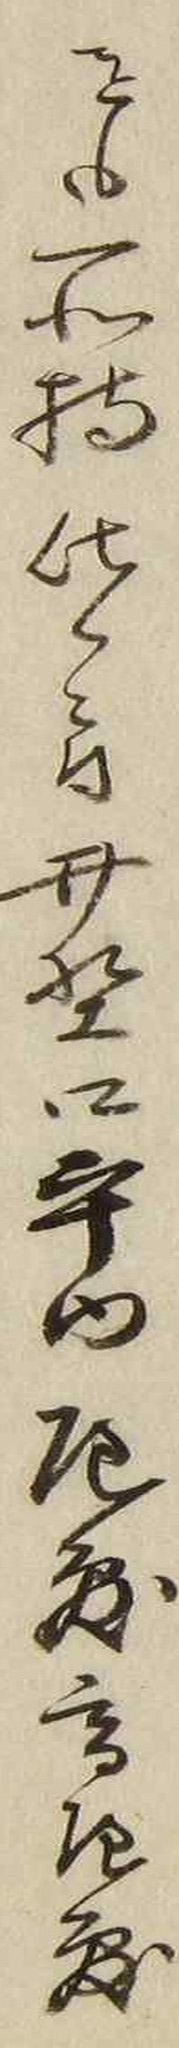をも所持仕候ニ付井野口平内屋敷高屋敷
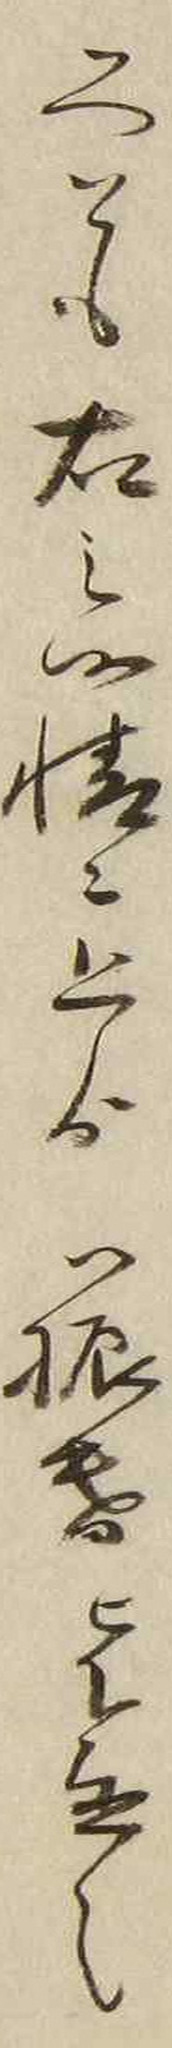候へとも右之の御情ニ上ゟ御振替被下置之

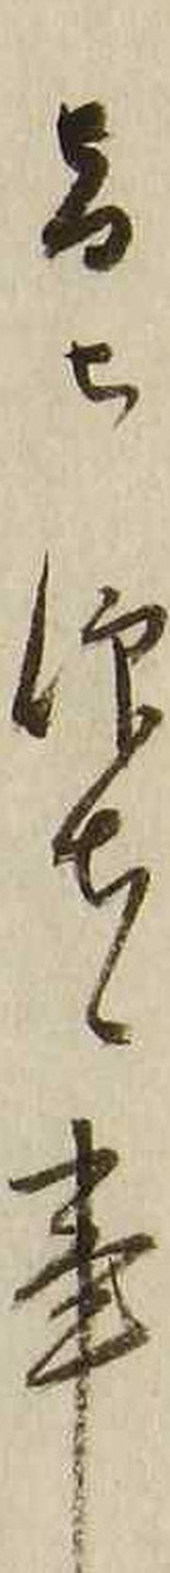旨被仰出候事
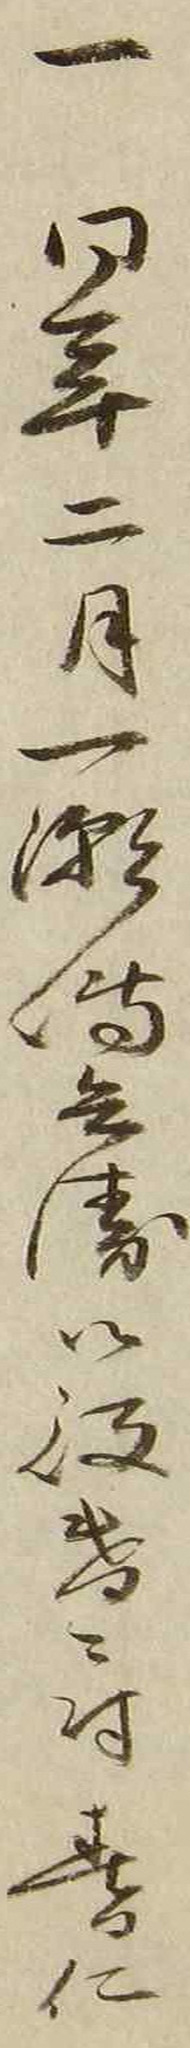一同年二月一瀬伝兵衛御役替ニ付春日仁
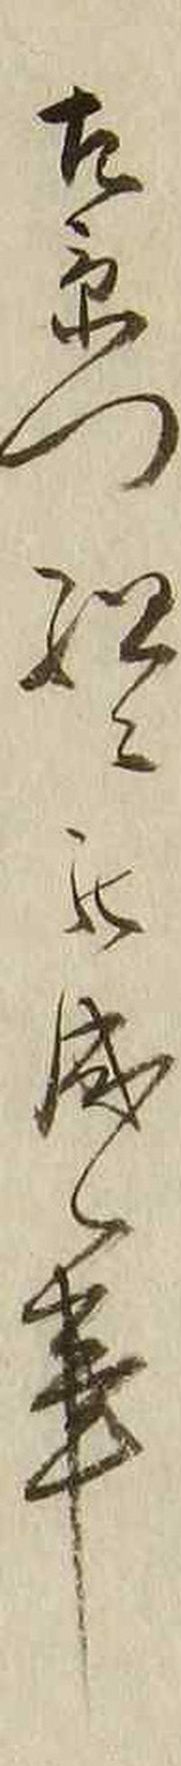左衛門組ニ罷成候事
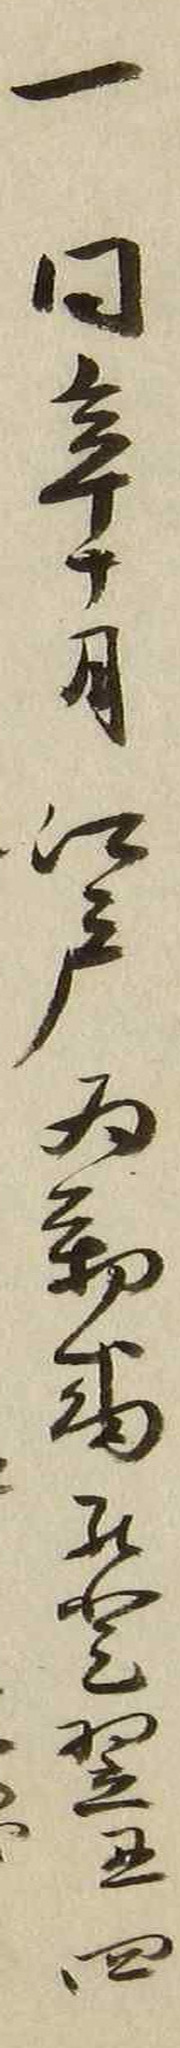一同年十月江戸為勤番罷登翌丑四
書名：諸士系譜　巻之311　し之部1
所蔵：会津若松市立会津図書館
